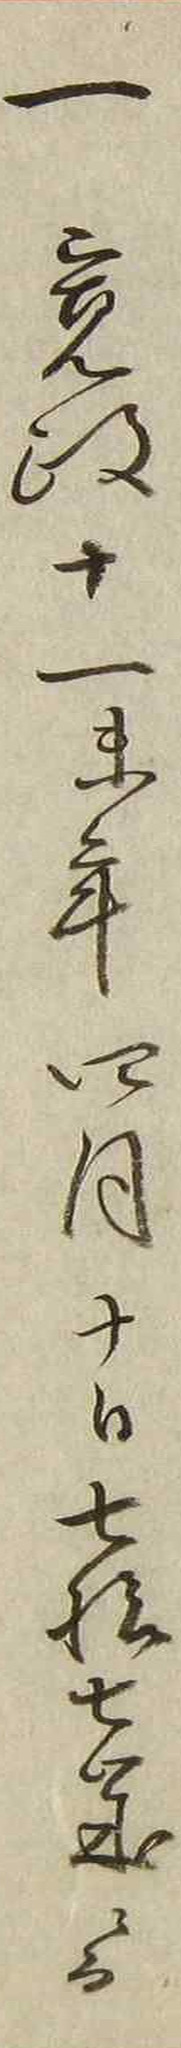一寛政十一未年四月十日七拾七歳に而

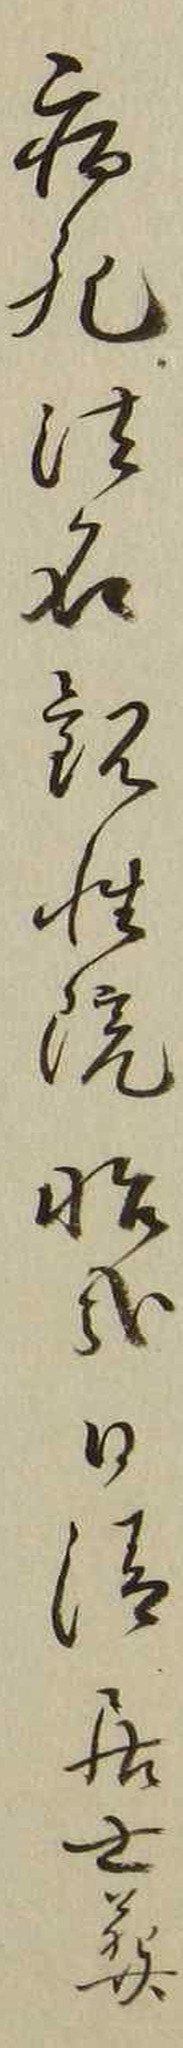病死法名観性院怡哉日清居士葬
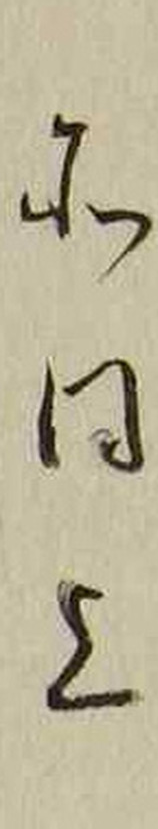所同上
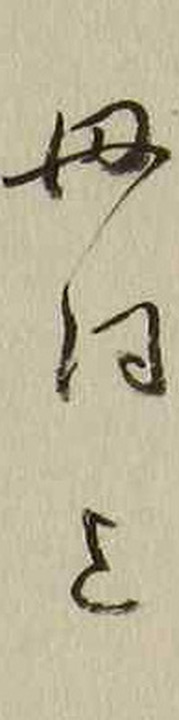母同上
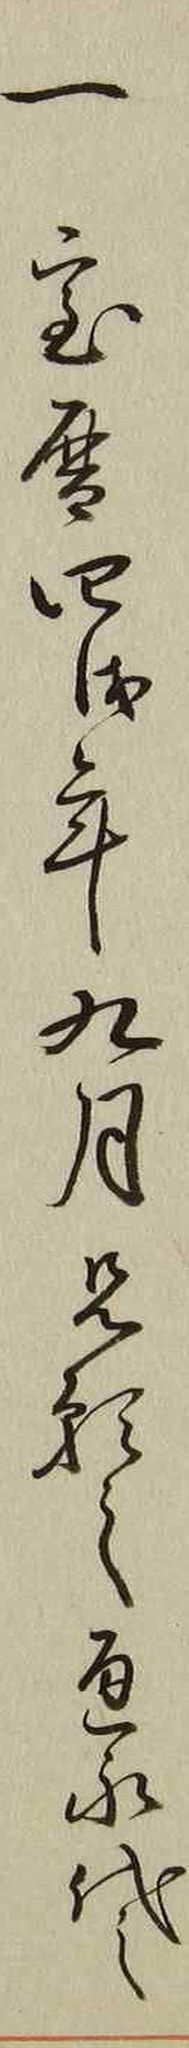一宝暦四戌年九月兄願之通永代之
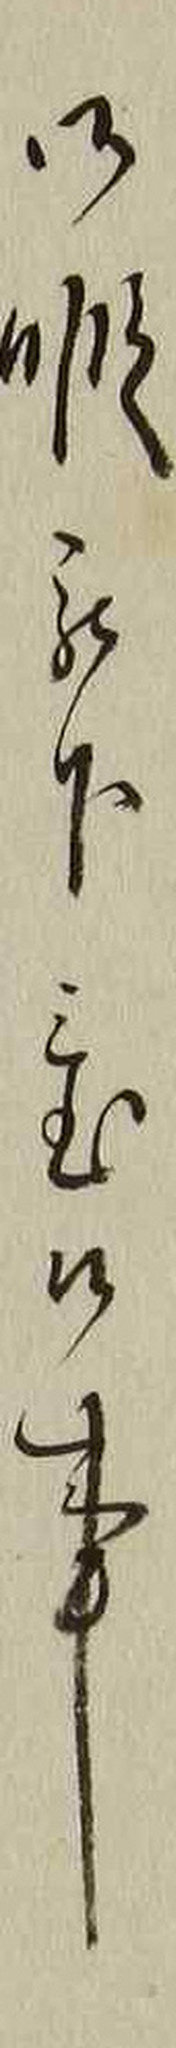御暇被下置候事
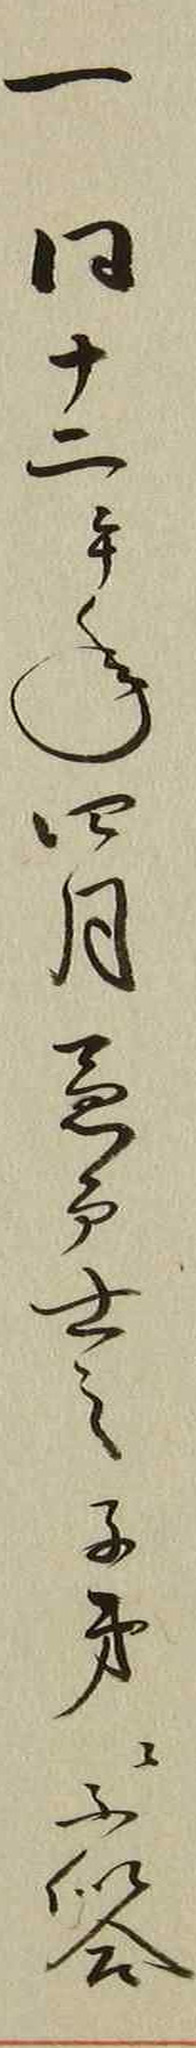一同十二午年四月兼而士之子弟に不似合
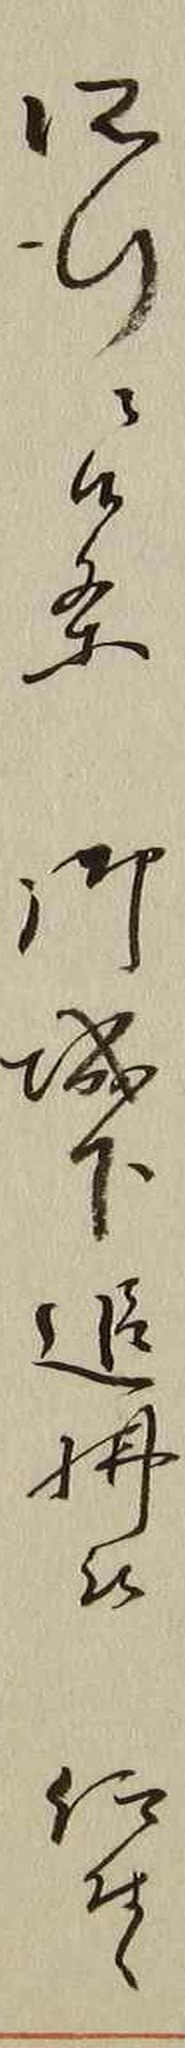所行に候条御城下追払被仰付候
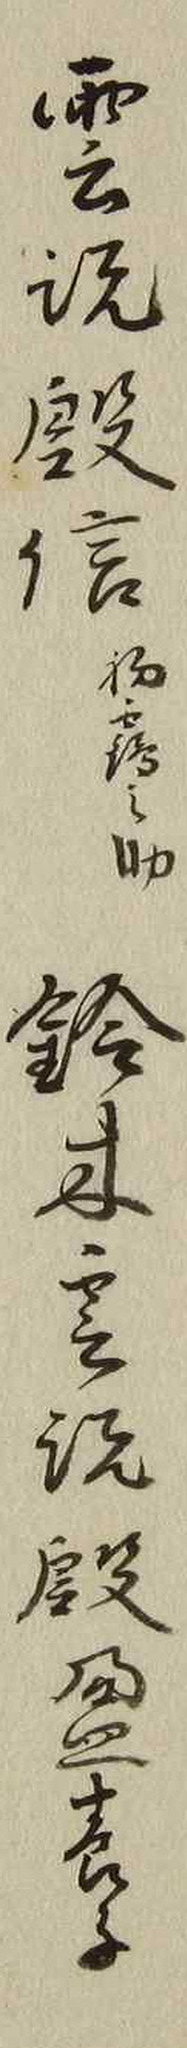雲説殷信初鶴之助鈴木雲説殷盈養子
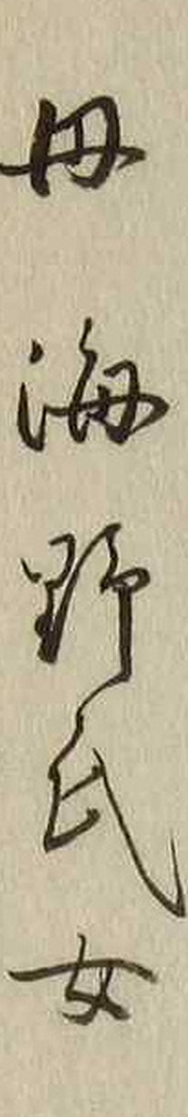母海野氏女
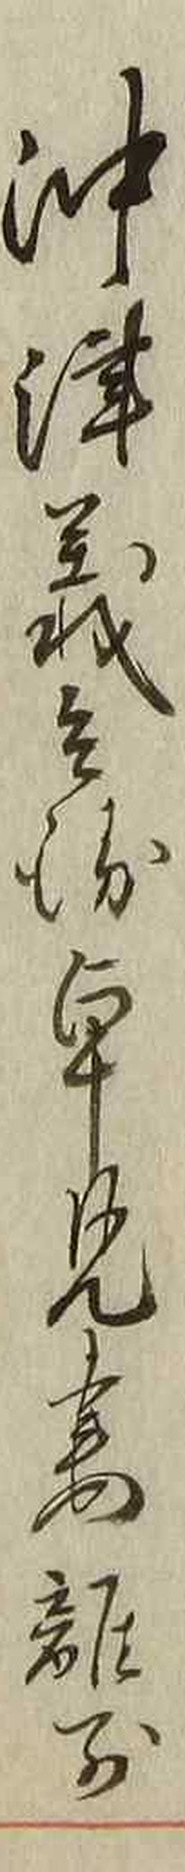女沖津義兵衛卓見妻離別
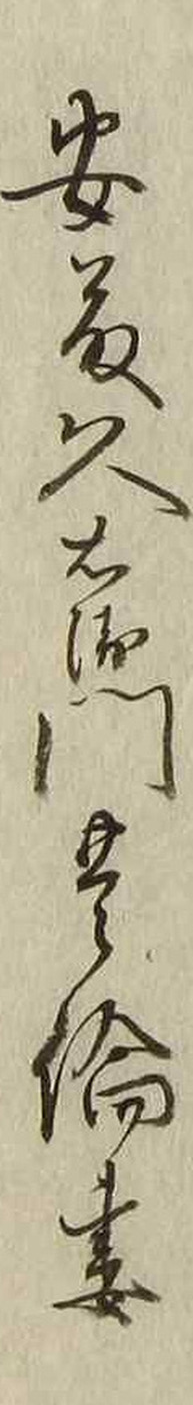安藤久右衛門豊倫妻
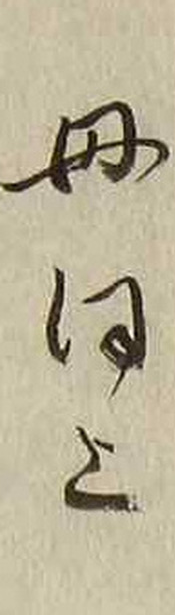母同上
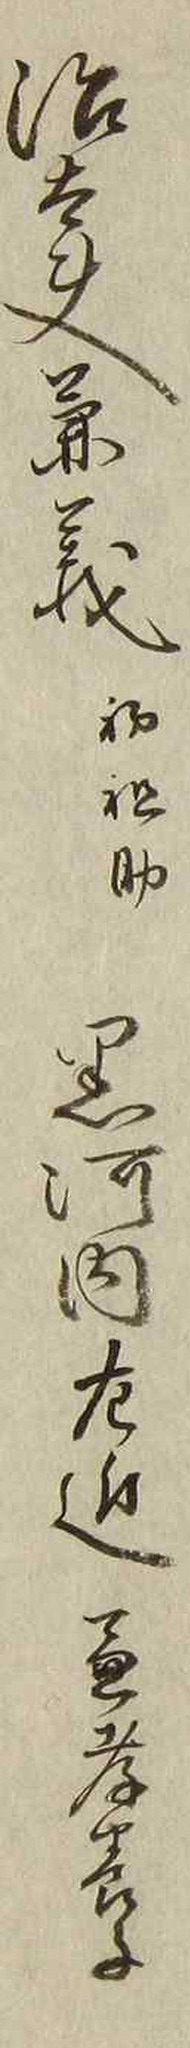治太夫兼義初祖助黒河内左近兼孝養子
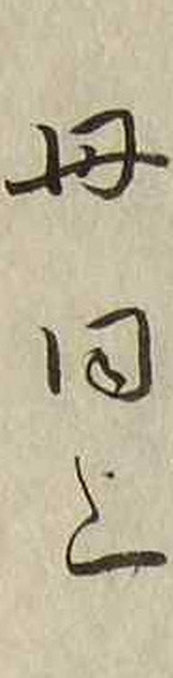母同上

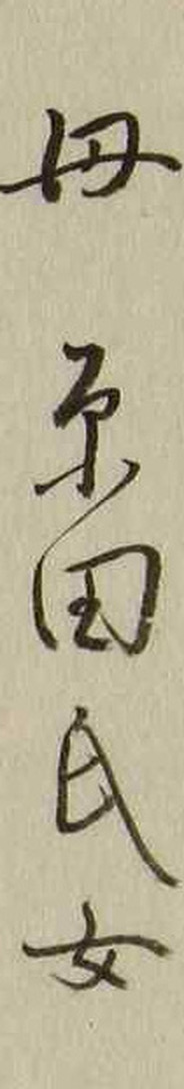母原田氏女
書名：諸士系譜　巻之3　い之部3
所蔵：会津若松市立会津図書館
